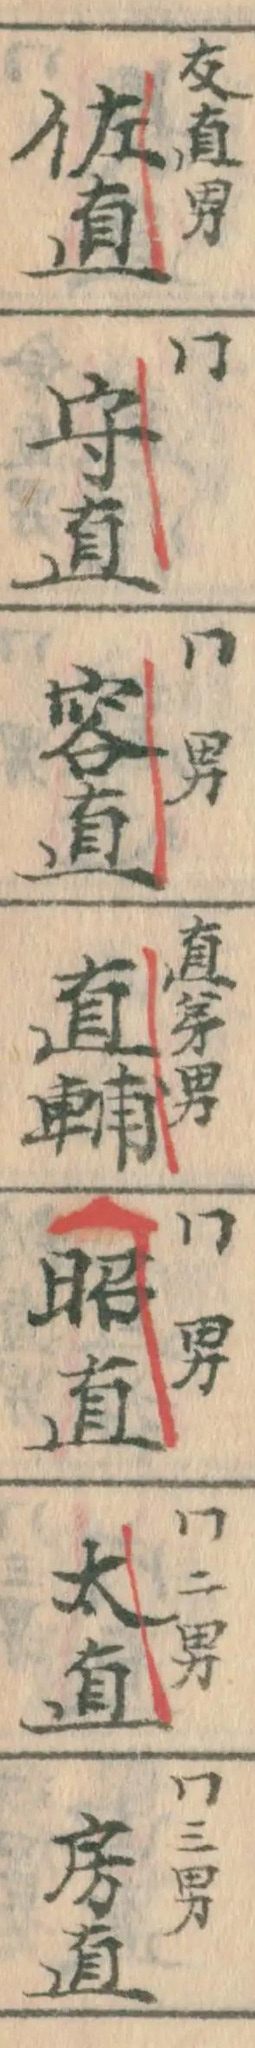佐直守直容直直輔▲昭直太直房直

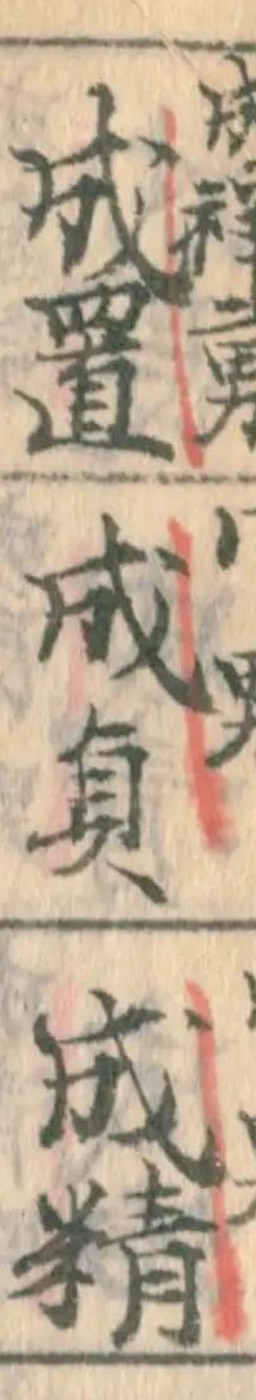成置成貞成精
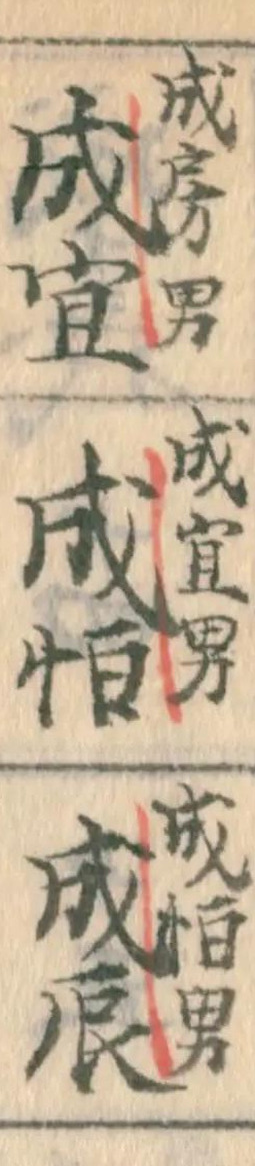成宜成怕成辰
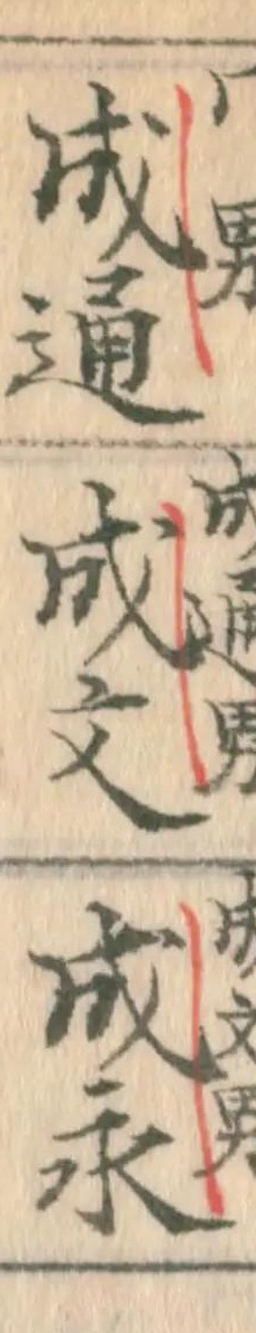成通成文成永
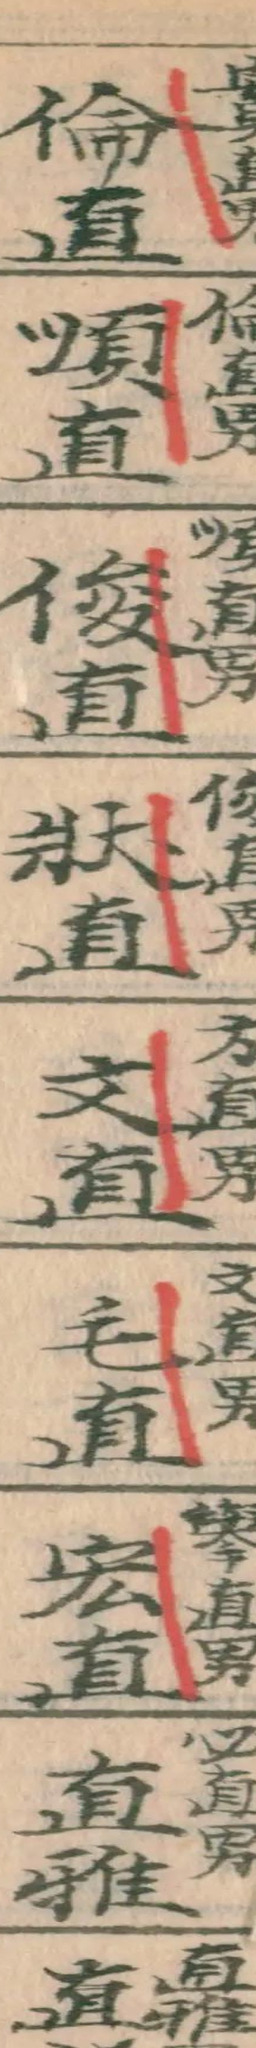倫直順直俊直状直文直毛直宏直直雅直穏
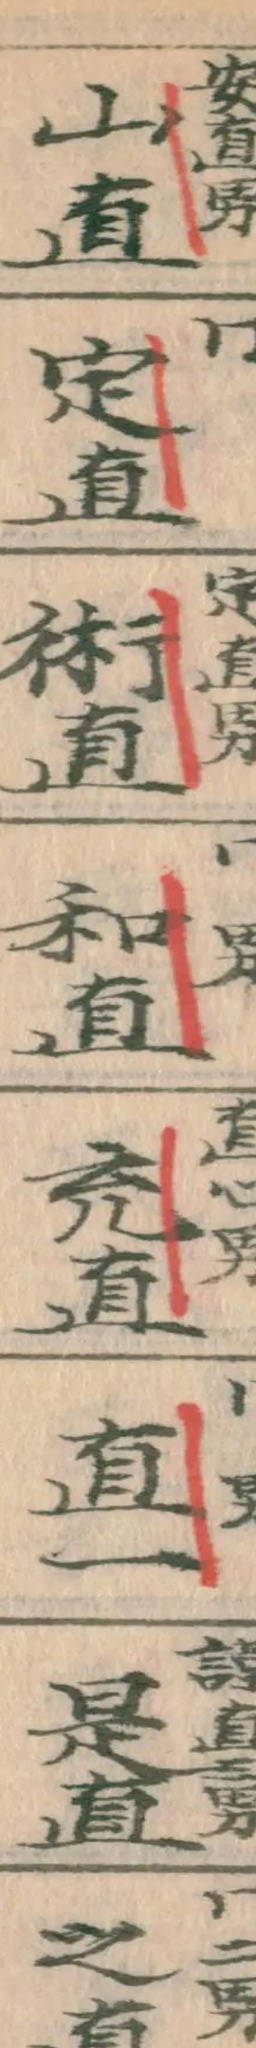山直定直術直和直充直直一是直之直
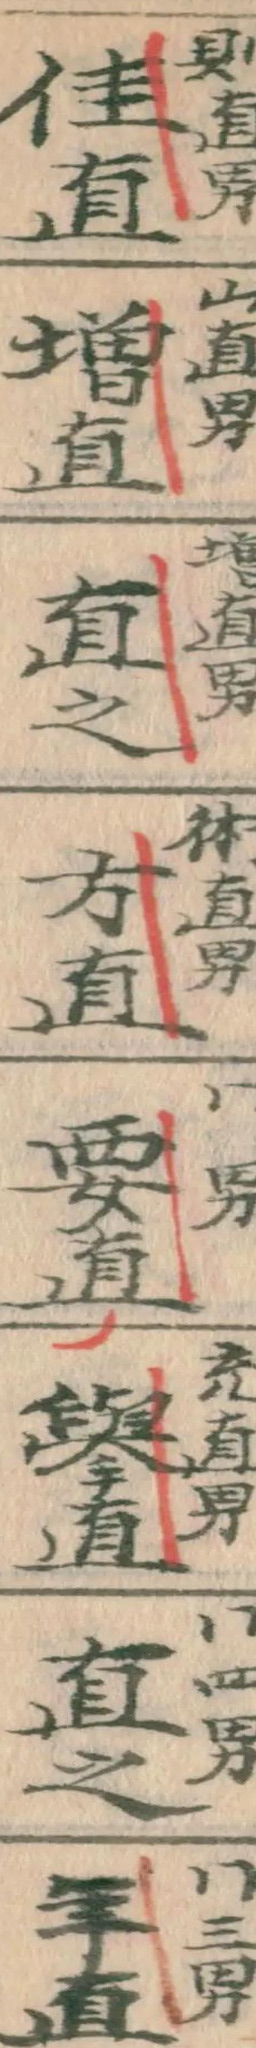佳直増直直之方直要直挙直直之年直
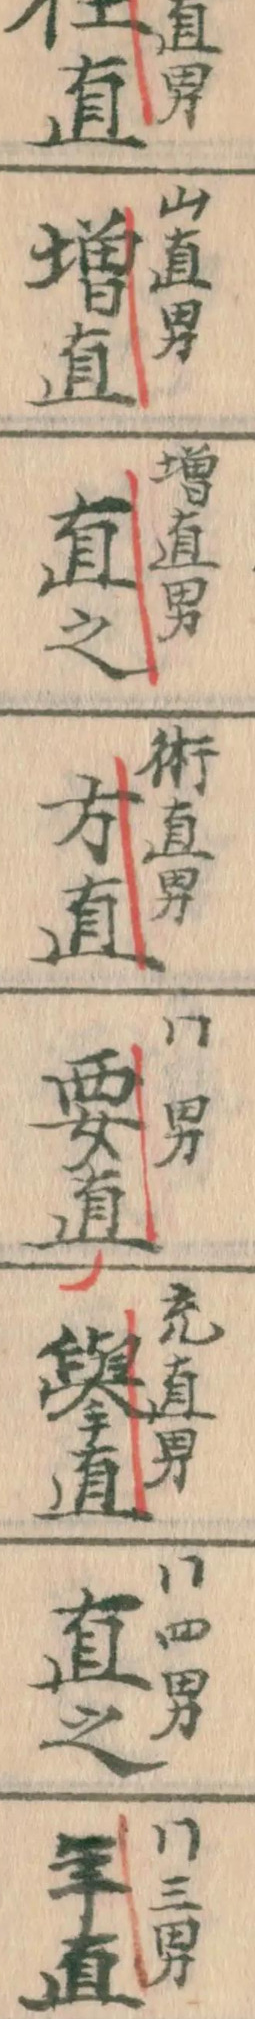佳直増直直之方直要直挙直直之年直
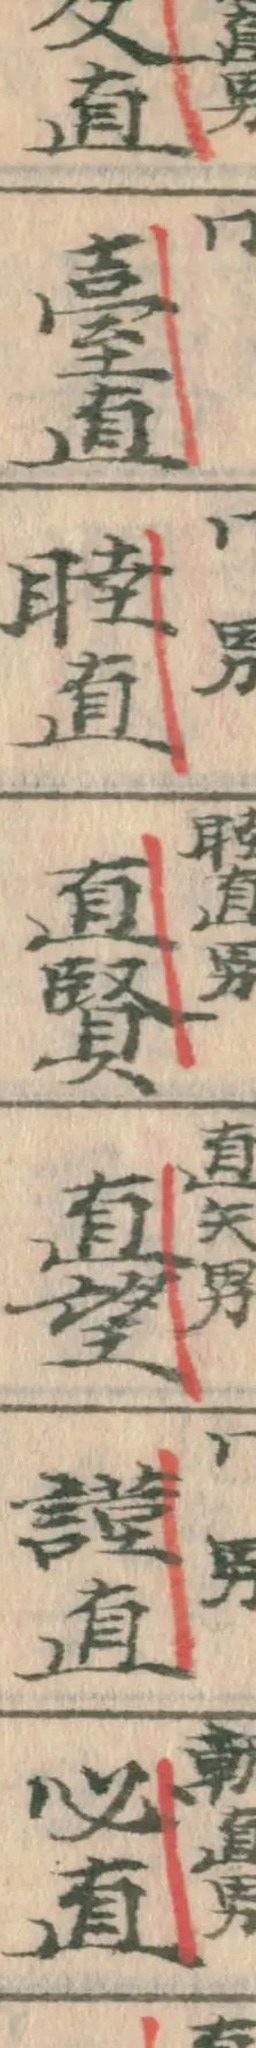友直台直睦之直賢直望謹直必直
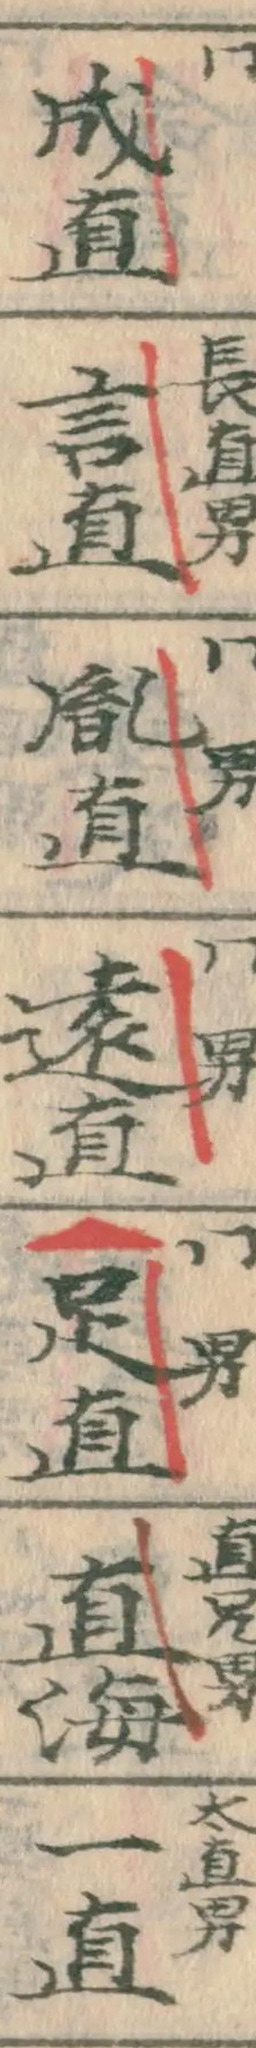成直言直胤直遠直▲足直直海一直
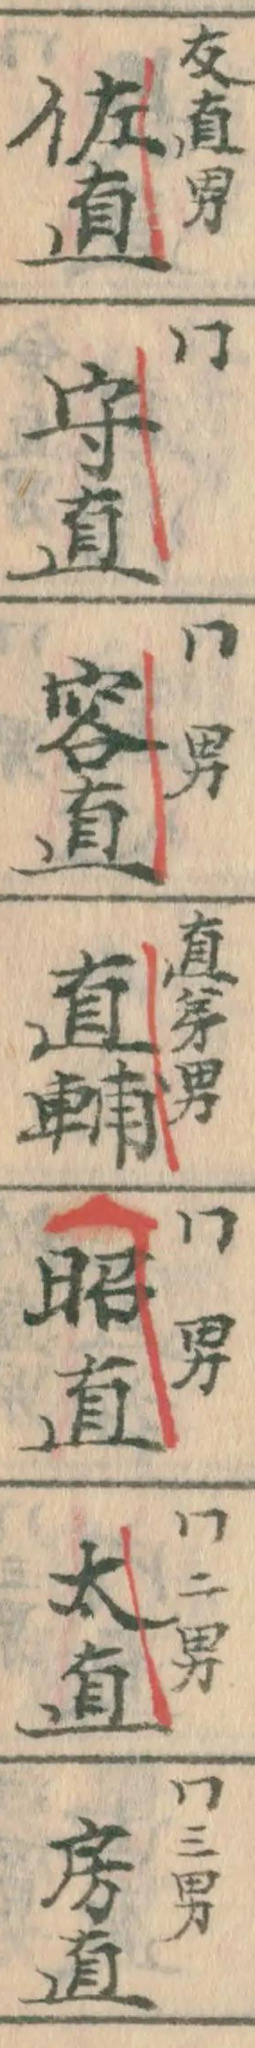佐直守直容直直輔▲昭直太直房直

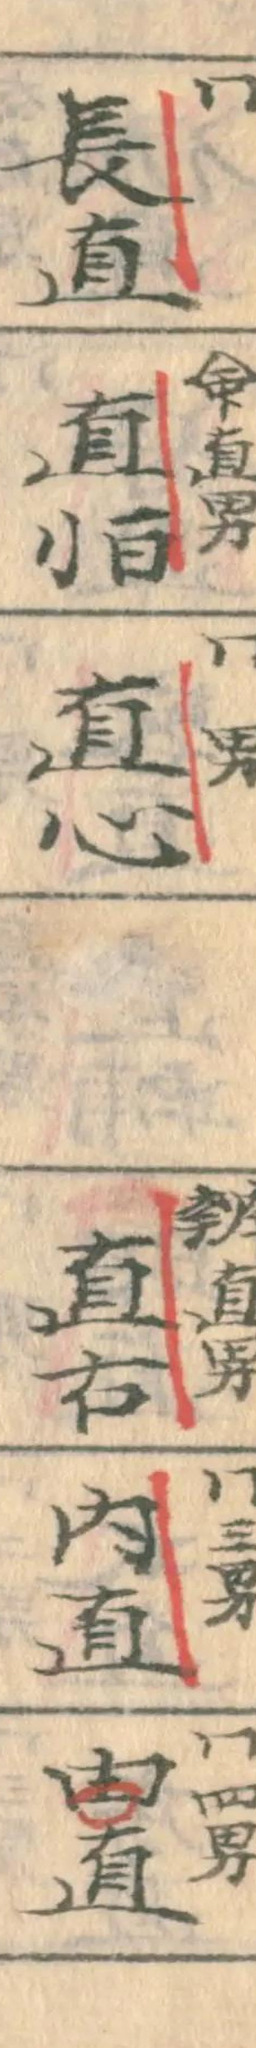長直直怕直心直右内直由直
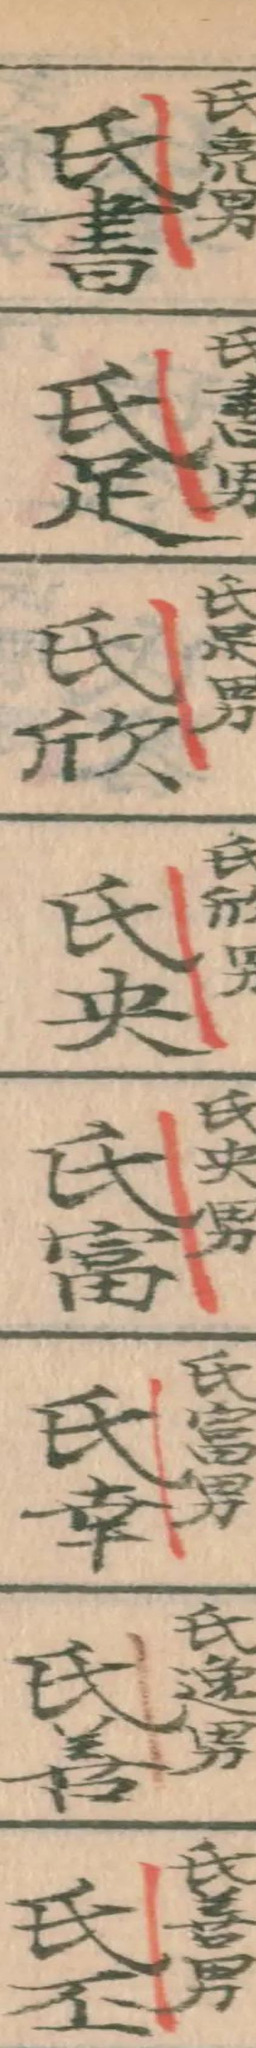氏書氏足氏欣氏央氏富氏幸氏善氏丕
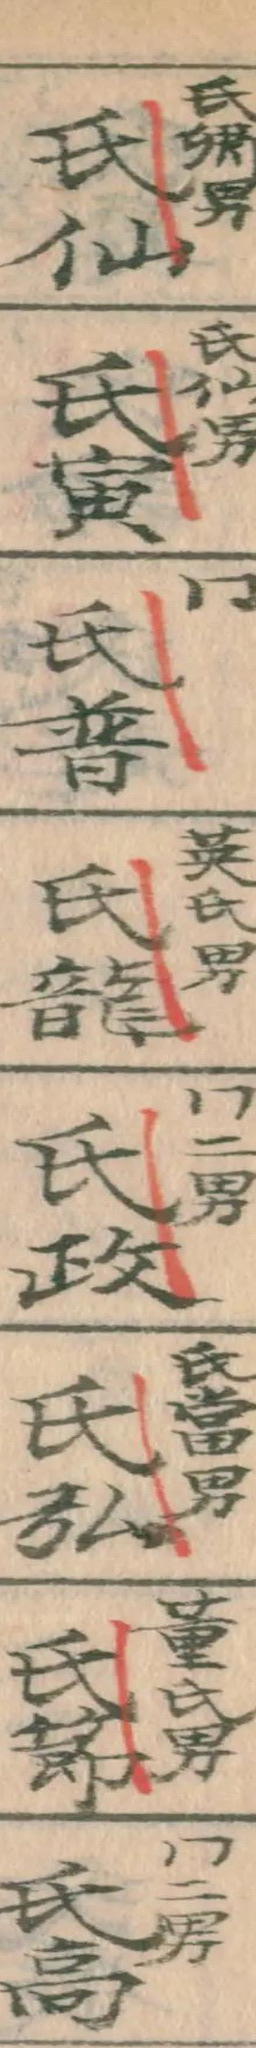氏仙氏寅氏普氏龍氏政氏弘氏節氏高
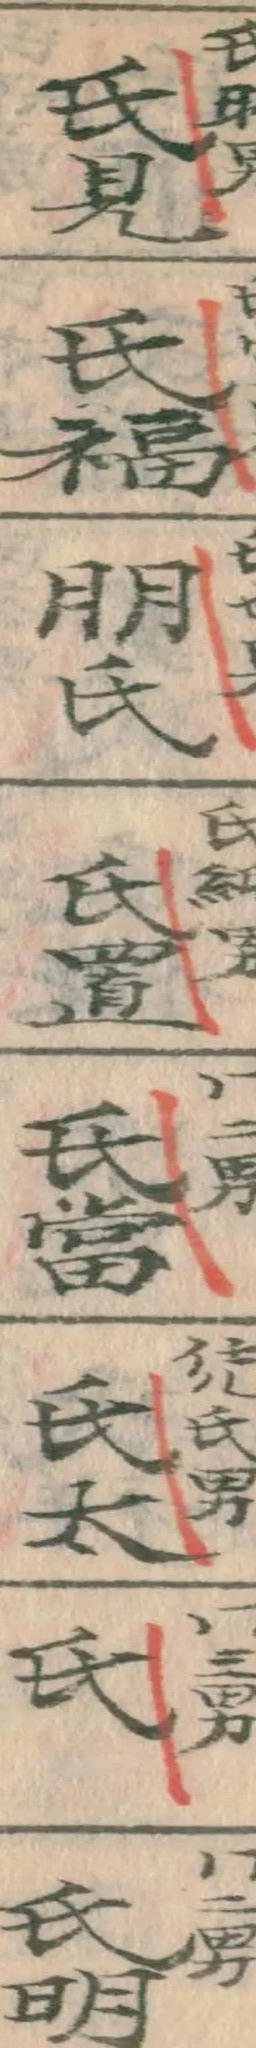氏見氏福朋氏氏置氏当氏太氏氏明
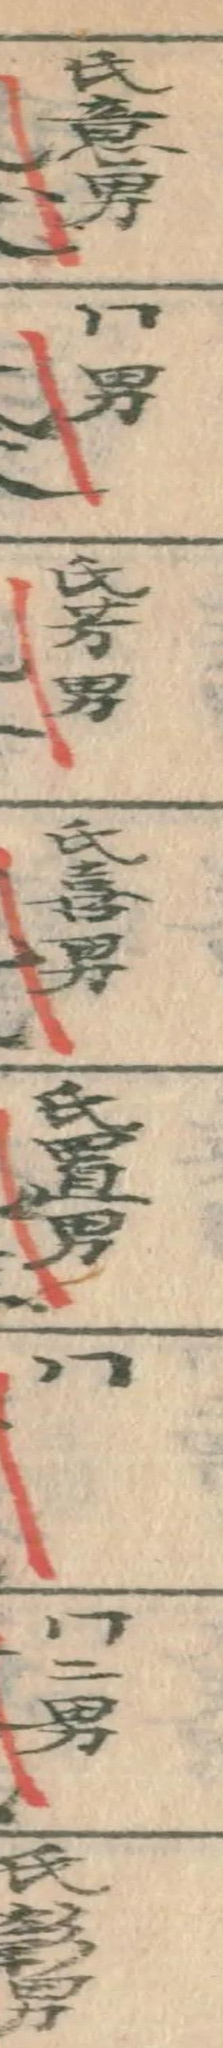氏意男同男氏芳男氏喜男氏置男同同二男氏彰男
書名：賀茂社記録. 第24冊
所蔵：国立国会図書館 National Diet Library, JAPAN
